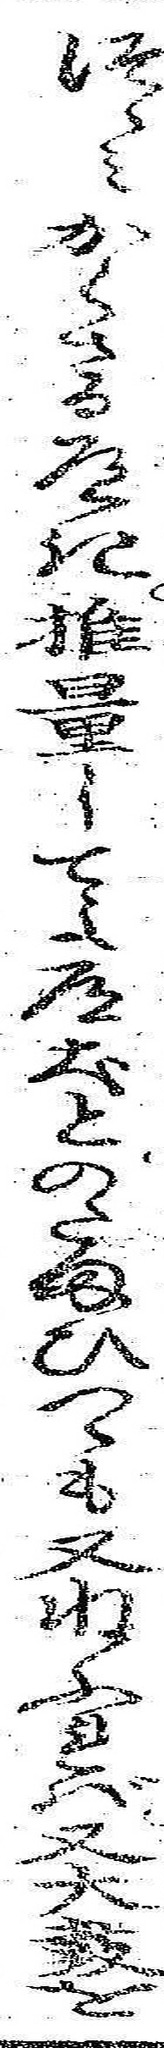つゝみかくさるべき。推量してよ道犬と。のたまひつゝも又ねふれば。又大鼓を
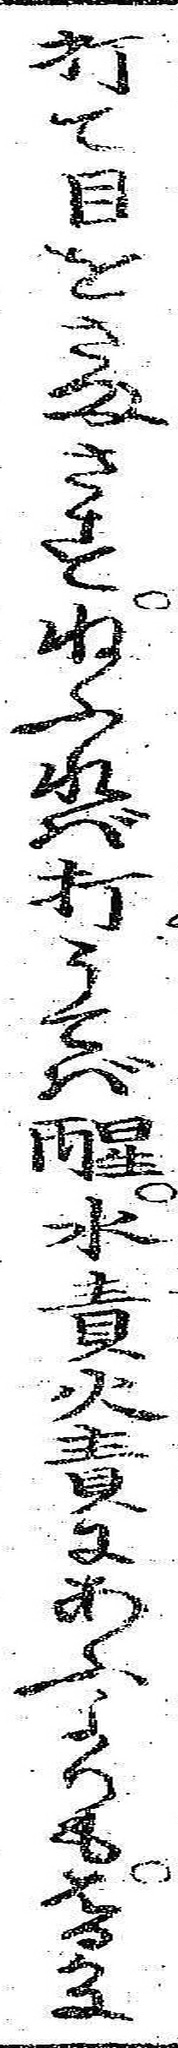打て目をさまさす。ねふれば打うてば醒。水責火責にあふよりも。はるかに
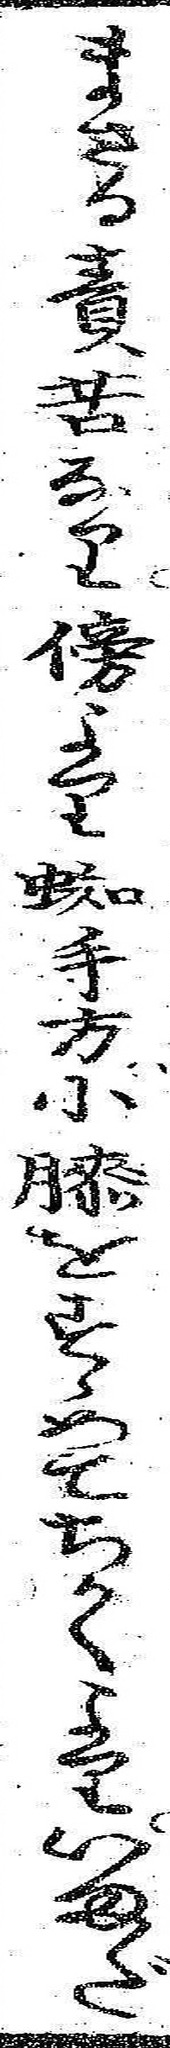まさる責苦なり。傍より蜘手方。小膝をすゝめてちかくより。いまだ
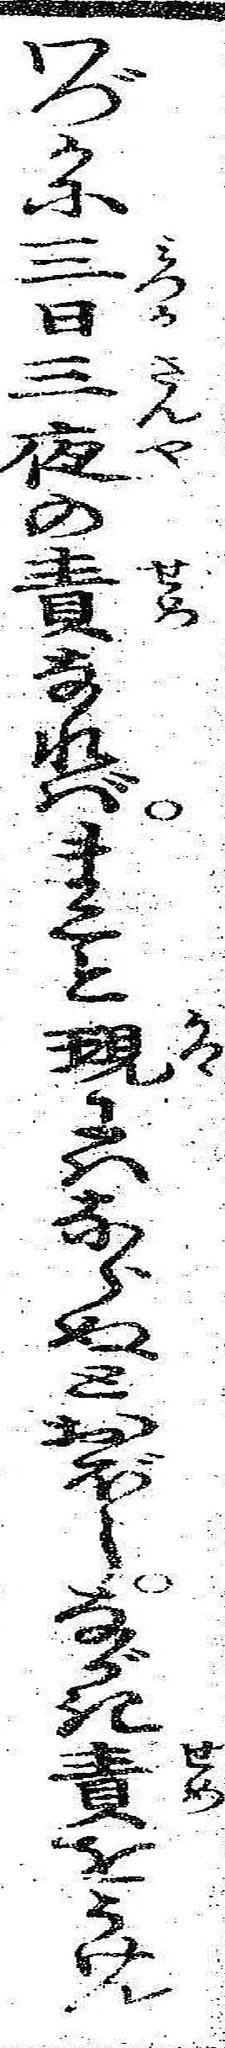わづかに三日三夜の責なれば。まこと現にはならぬとおぼし。ながき責をうけん
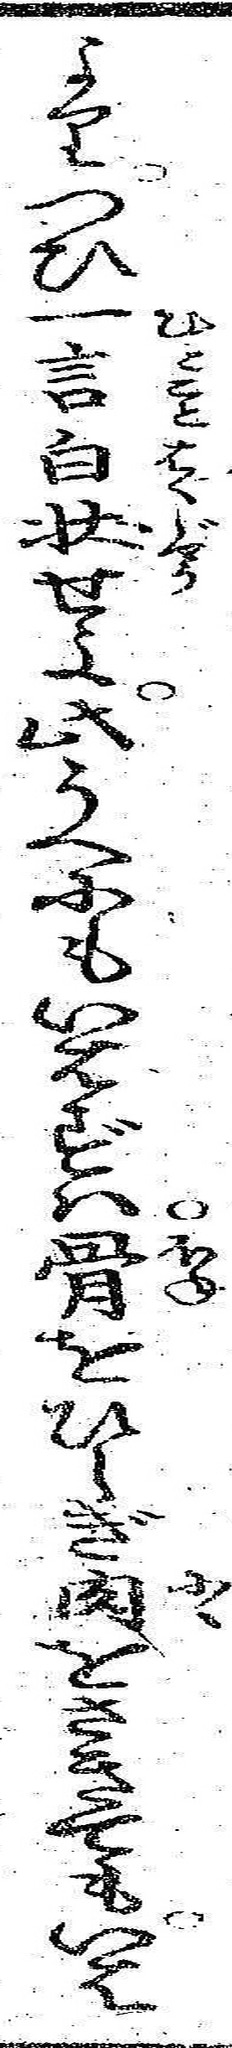より。つひ一言白状せよ。此うへにもいはずは。骨をひしぎ肉をさきても。いは
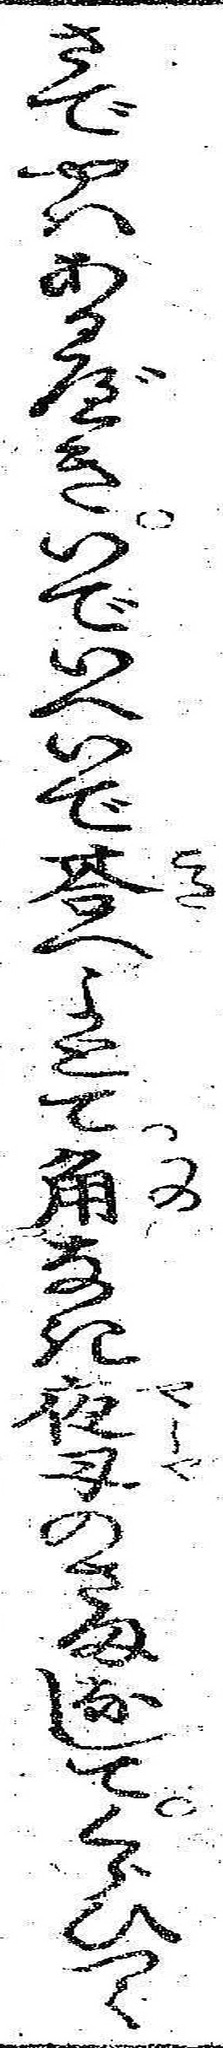さでやはあるべき。いでいへいで荅へよとて。角なき夜叉のさまなして。くらひつく
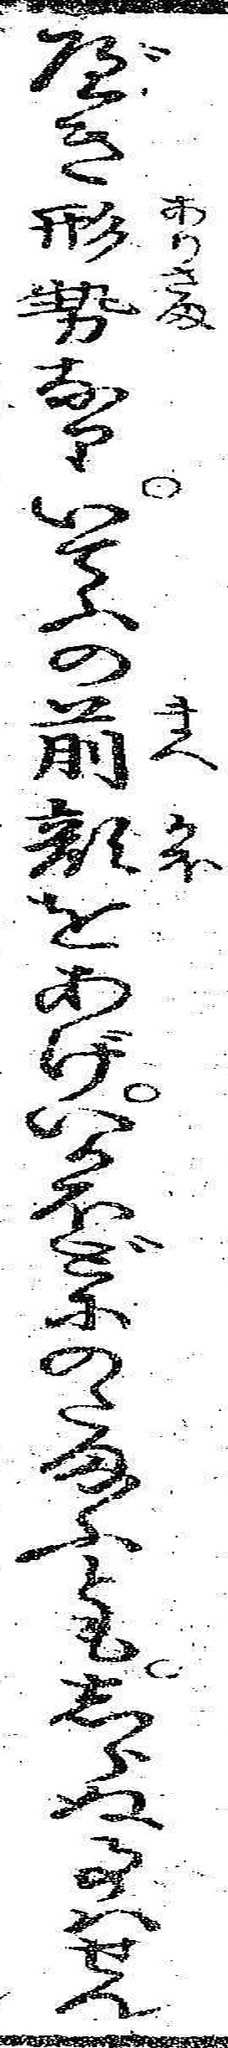べき形勢なり。いてふの前顔をあげ。いかほどにのたまふとも。しらぬ事はせん
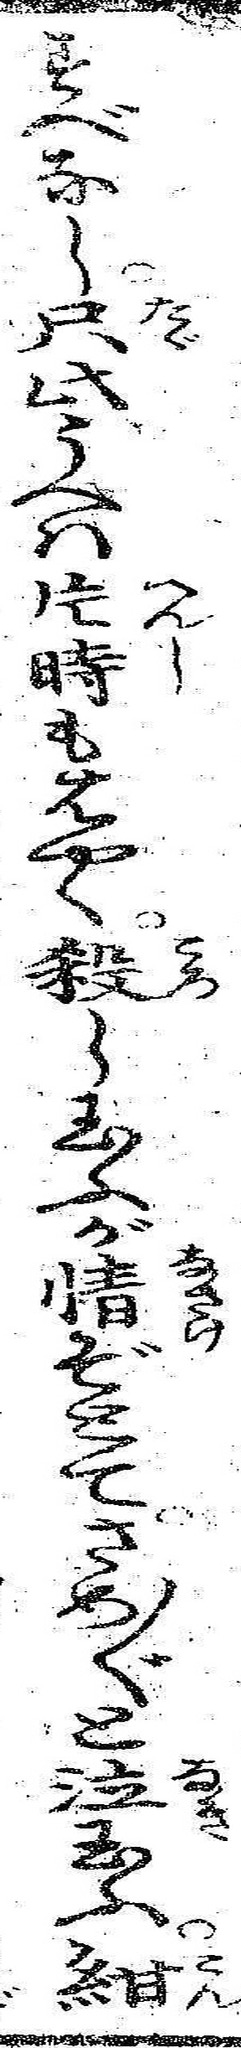すべなし。只此うへは片時もはやく。殺し玉ふが情ぞとて。さめ〴〵と泣玉ふ。紺
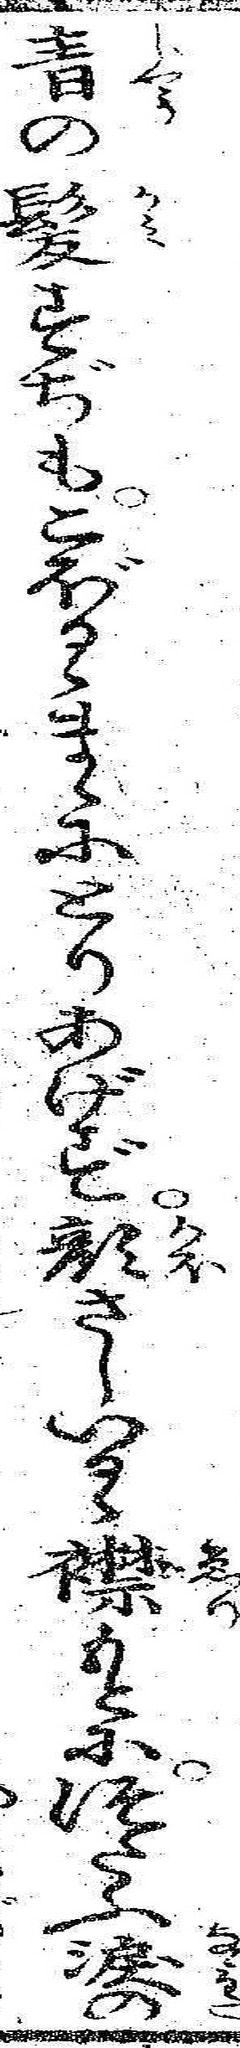青の髪すぢも。こぼるゝまゝにとりあげず。顔さしいるゝ襟もとに。つたふ涙の
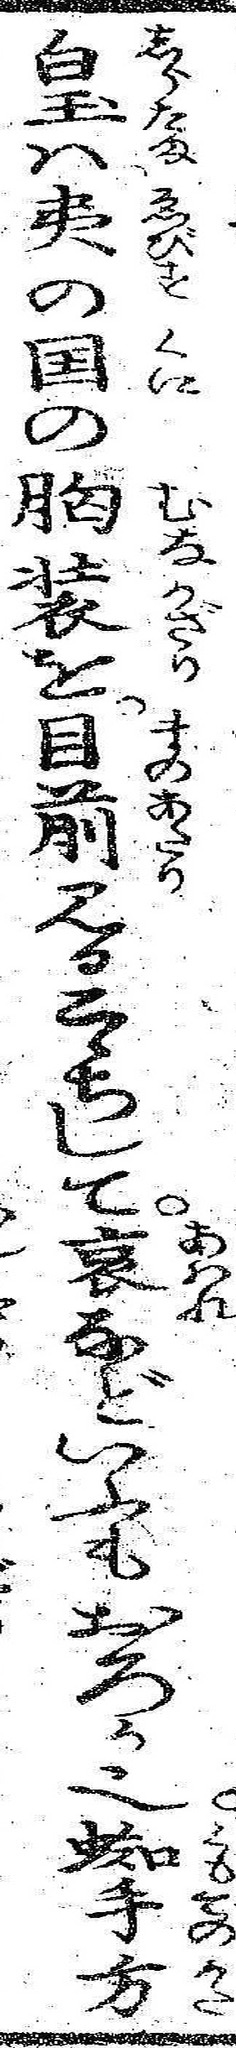白玉は。夷の国の胸装を。目前見るこゝちして。哀などいふもおろか也。蜘手方
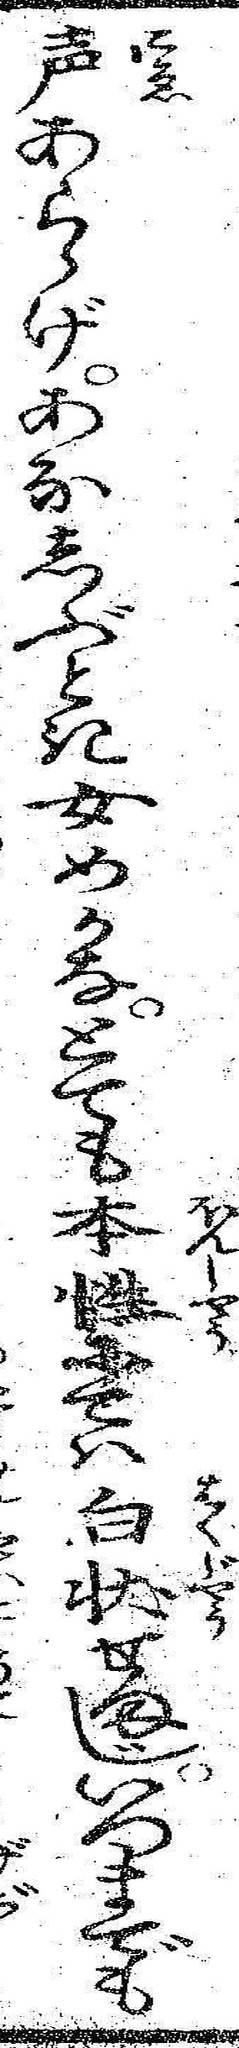声あらゝげ。あなしぶとき女めかな。とても本性にては白状せまじ。いつまでも
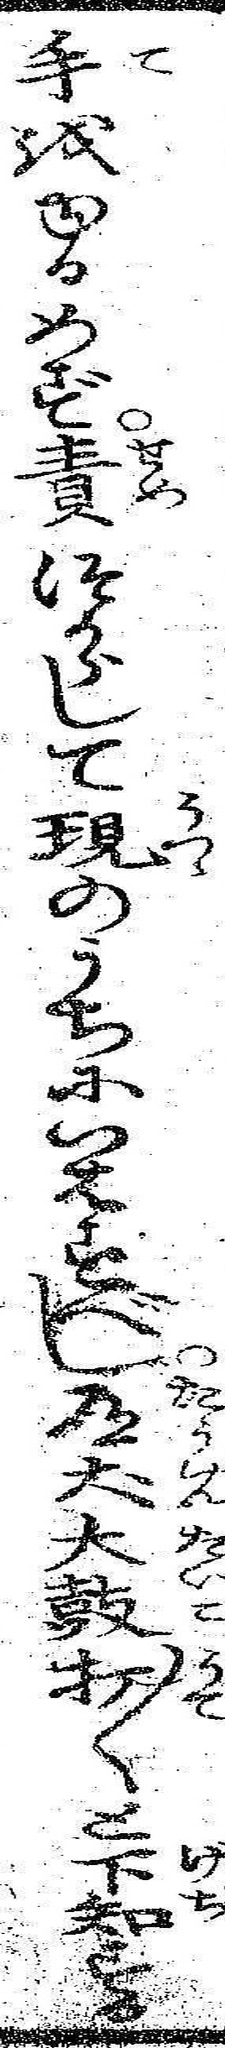手をゆるめず。責つからして現のうちにいはすべし。道犬大鼓打〳〵と下知する
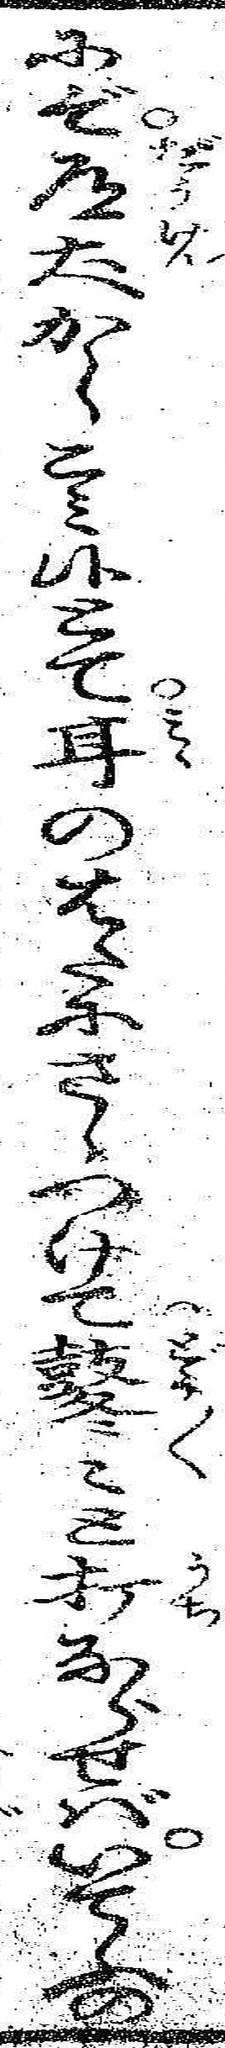にぞ。道犬かしこみ候とて。耳のはたにさしつけて。鼕々と打ならせば。いてふの
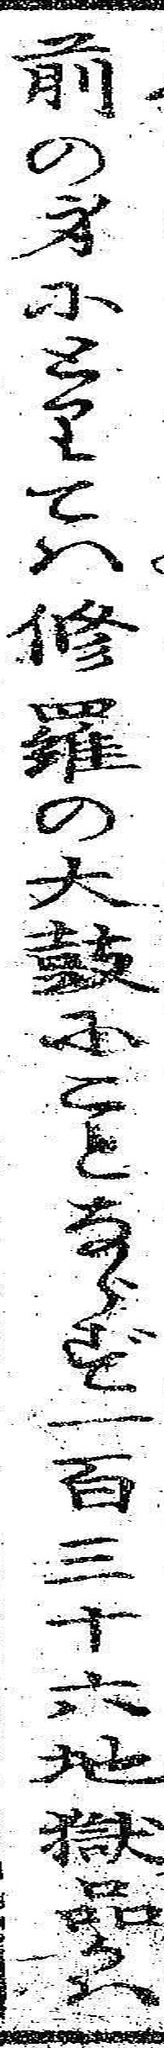前の身にとりては。修羅の大鼓にことならず。一百三十六地獄。品かは

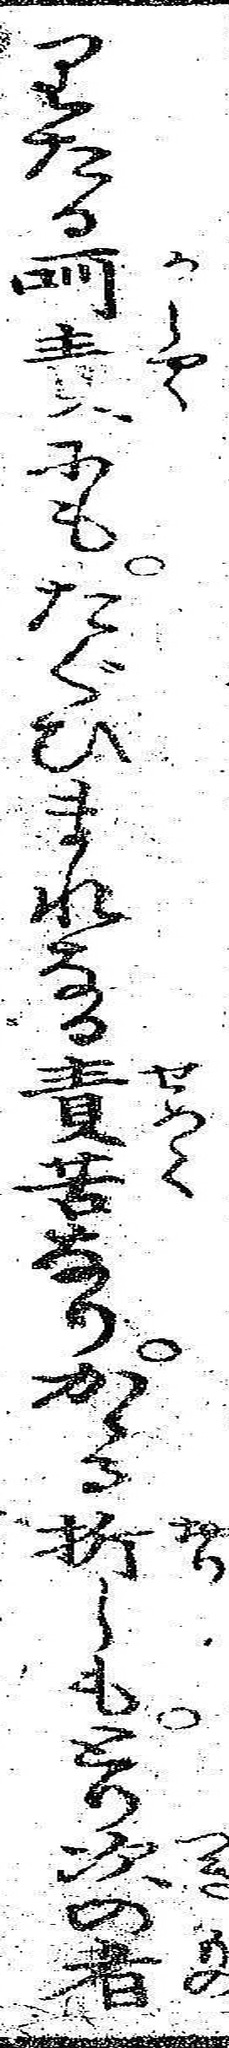りたる呵責にも。たぐひまれなる責苦なり。かゝる折しも。とり次の者
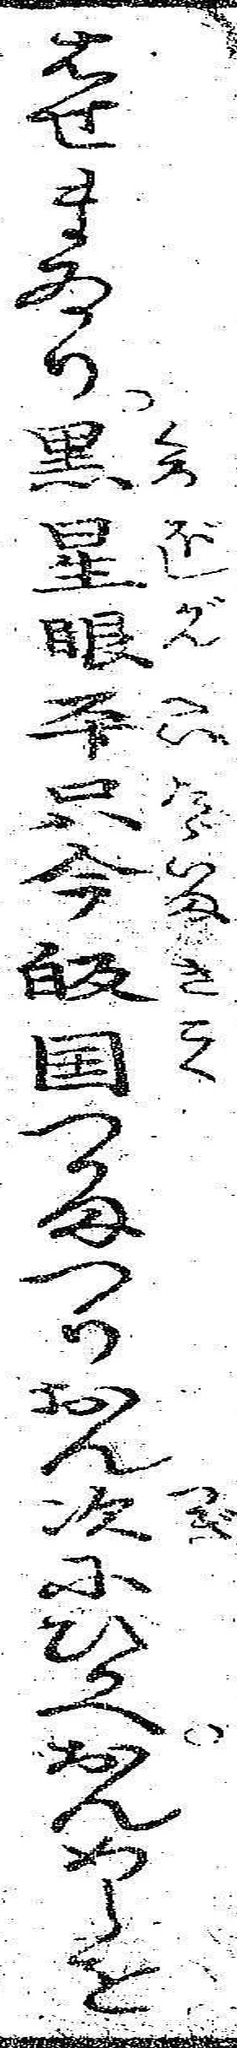はせまゐり。黒星眼平只今帰国つかまつりおん次にひかへ。おんめしを
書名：昔話稲妻表紙
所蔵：国文学研究資料館
